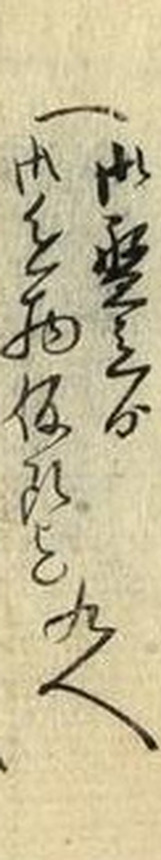御進物仮頭迄九人
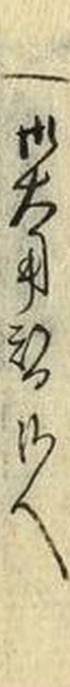御大用替弐人
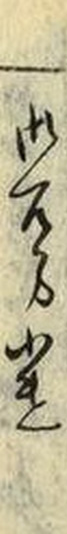御召方小遣
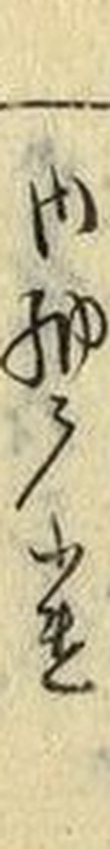御納戸小遣
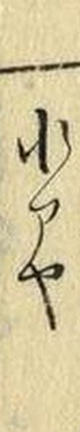水部や
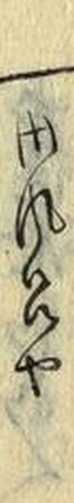御風呂や
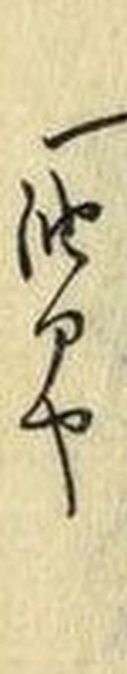油部や
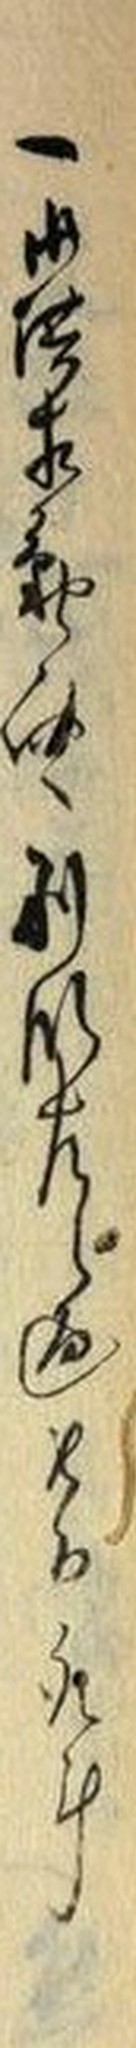一御供相勤候向へ別段左之通被下取計
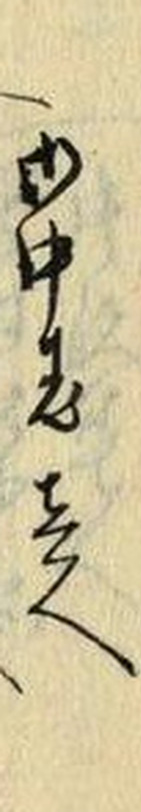御用人壱人
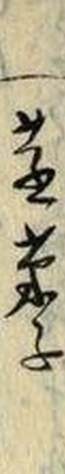蒸菓子
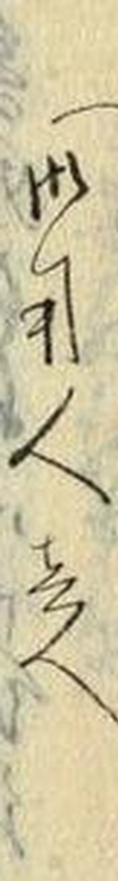御用人壱人
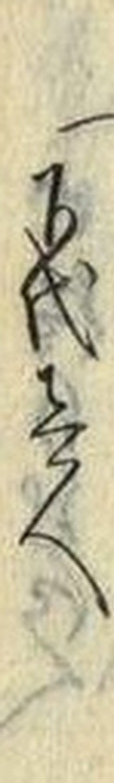下代壱人

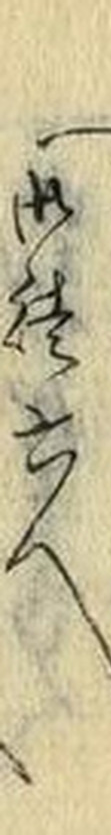御徒六人
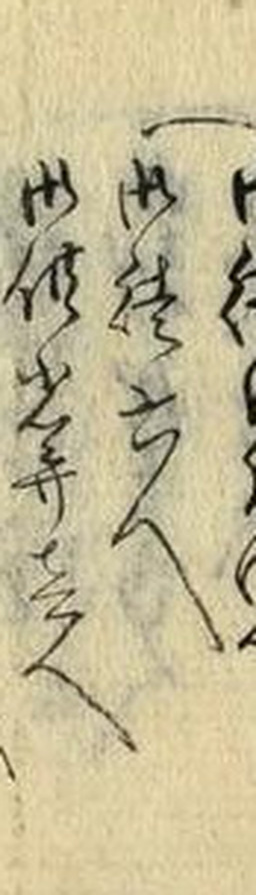同七御供小算壱人
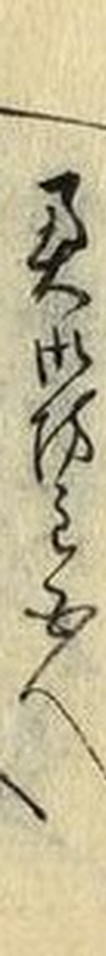奥御坊主五人
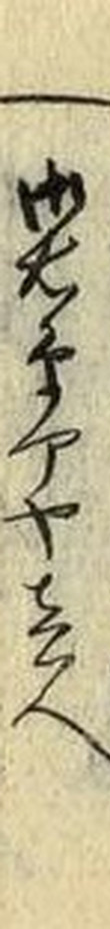御右筆部や壱人
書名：少傅日録抄（斉承付側向頭取日記、在国）
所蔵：福井県文書館 Fukui Prefectural Archives
